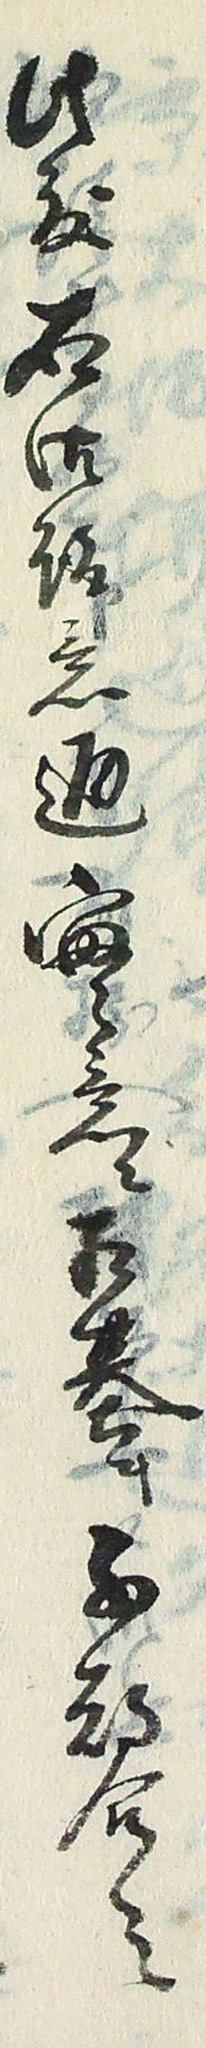此度右御趣意通実意に相基き不都合之
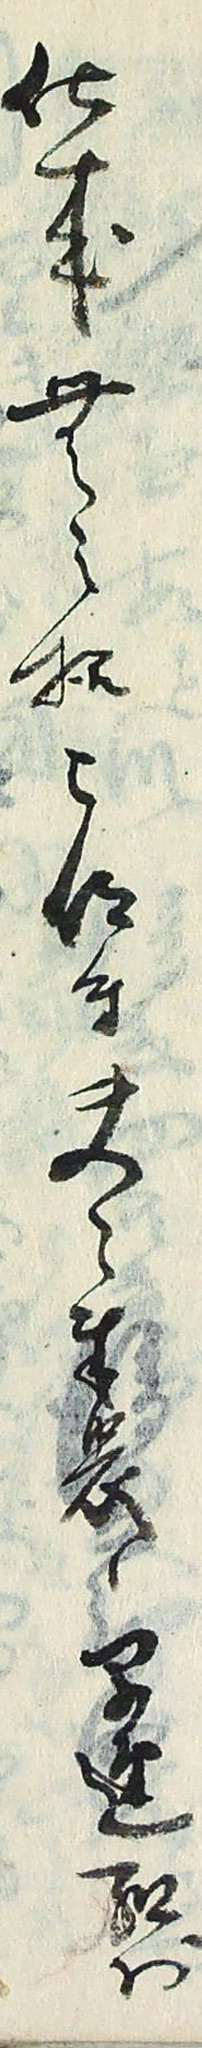仕来無之様被仰付夫々奉畏候早速組村
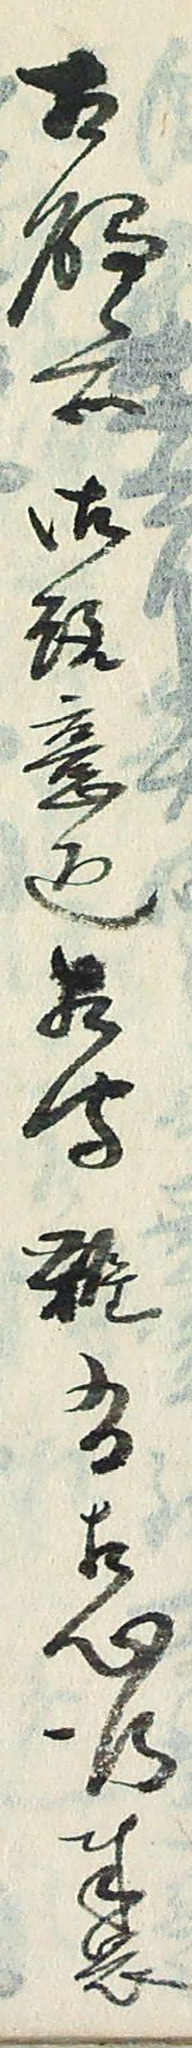相触候所御趣意通相守難有相心得奉畏
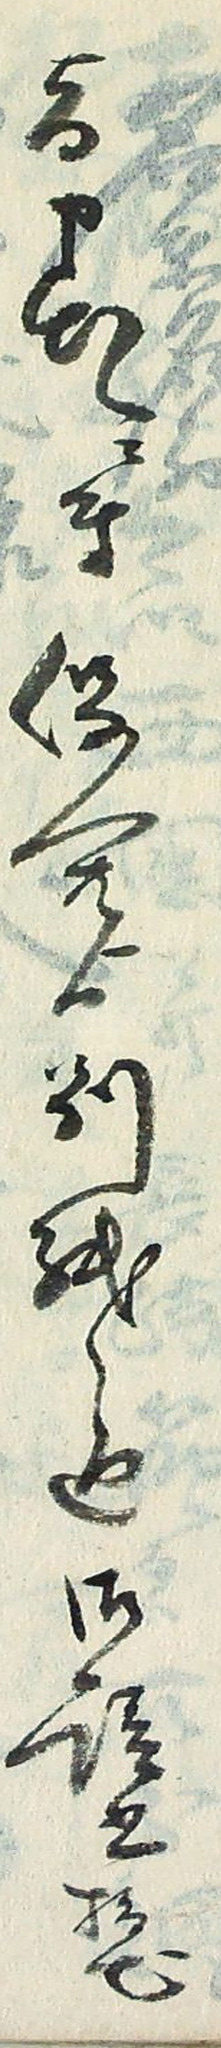旨申出候に付役人共ゟ別紙之通御請書指出
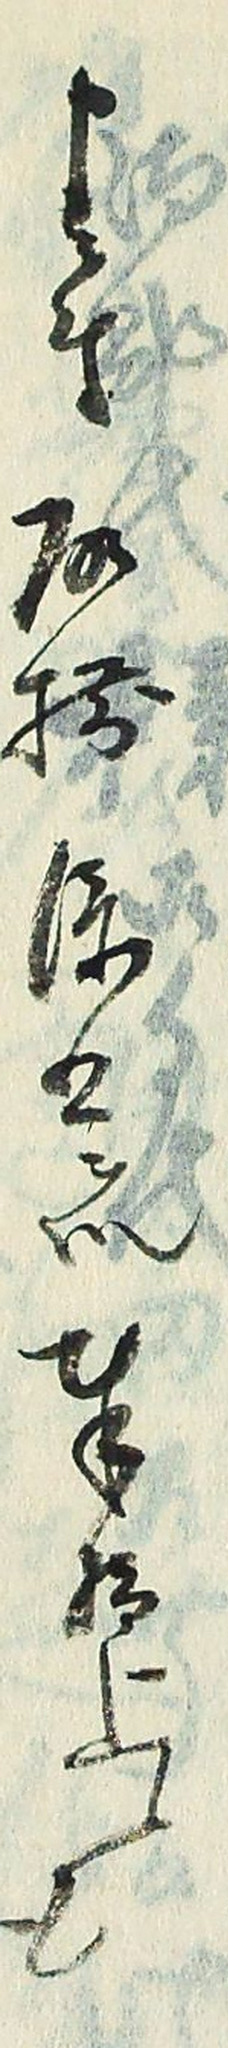申に付取揃添書を以奉指上候以上
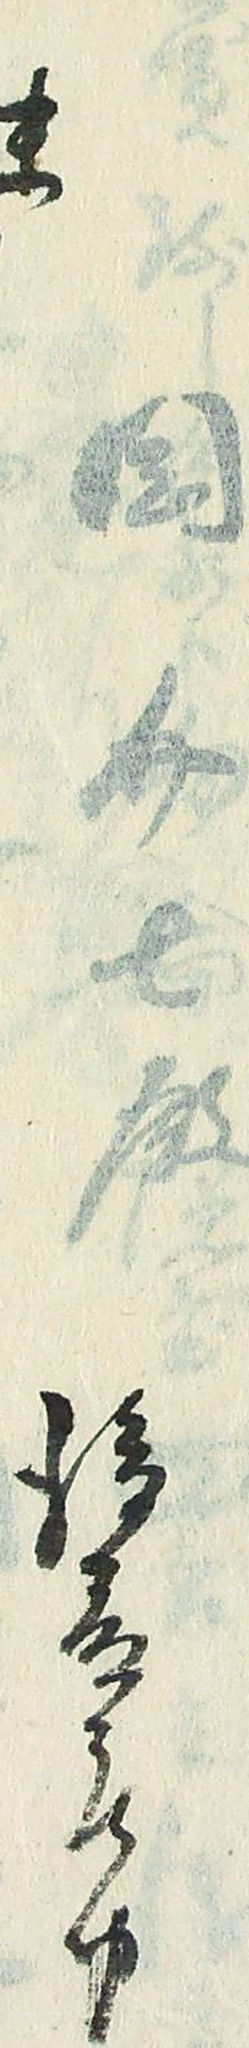後藤庄助
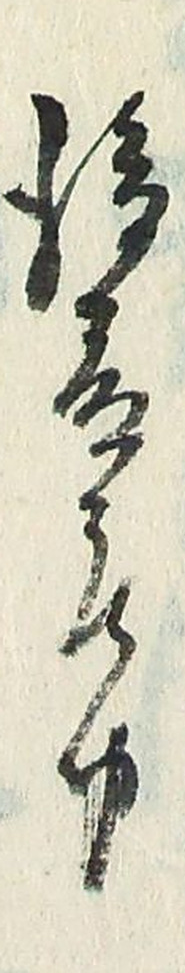後藤庄助
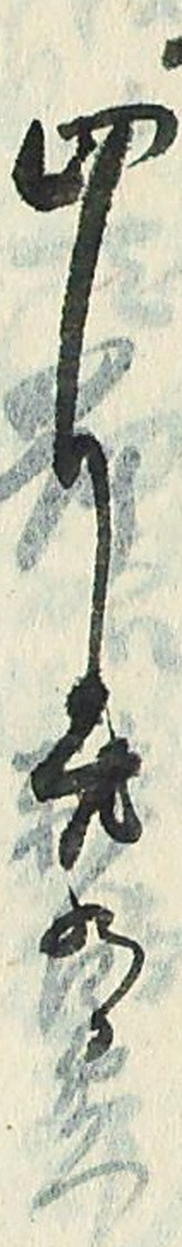四月廿九日
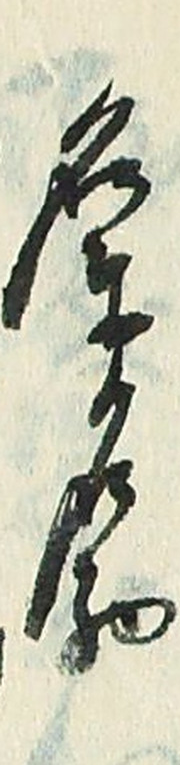名東名西
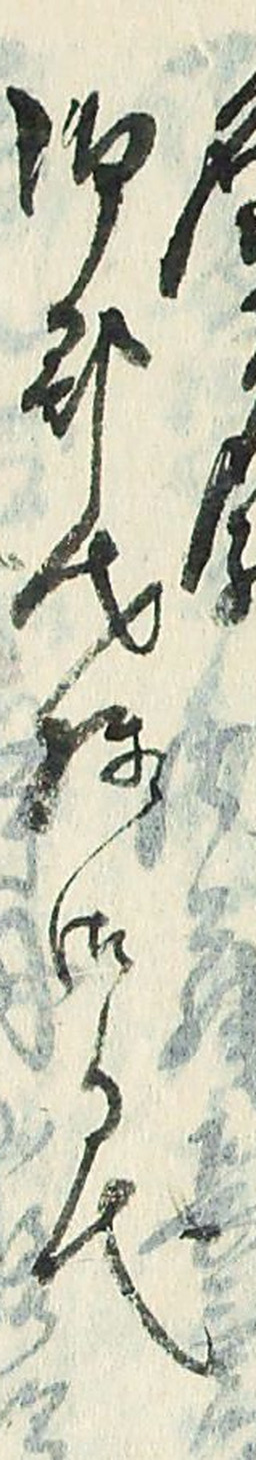御郡代様御手代
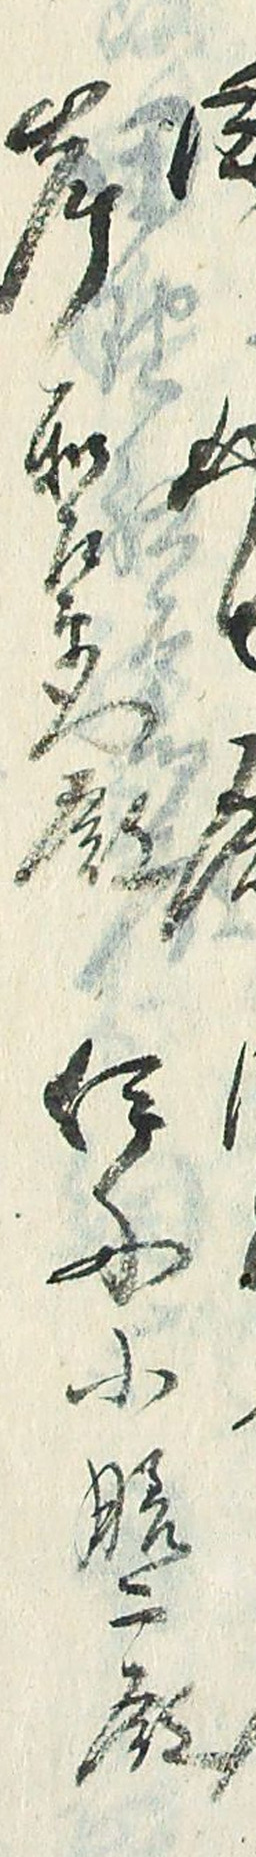岸和左衛門殿伊丹小膳二殿

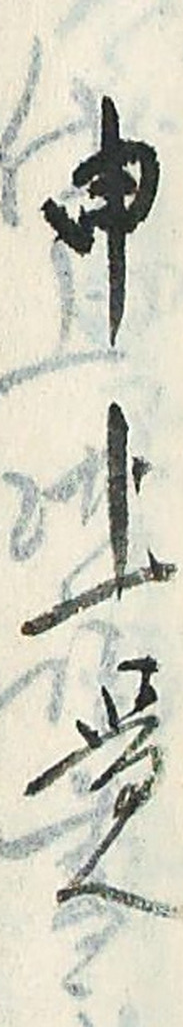申上覚
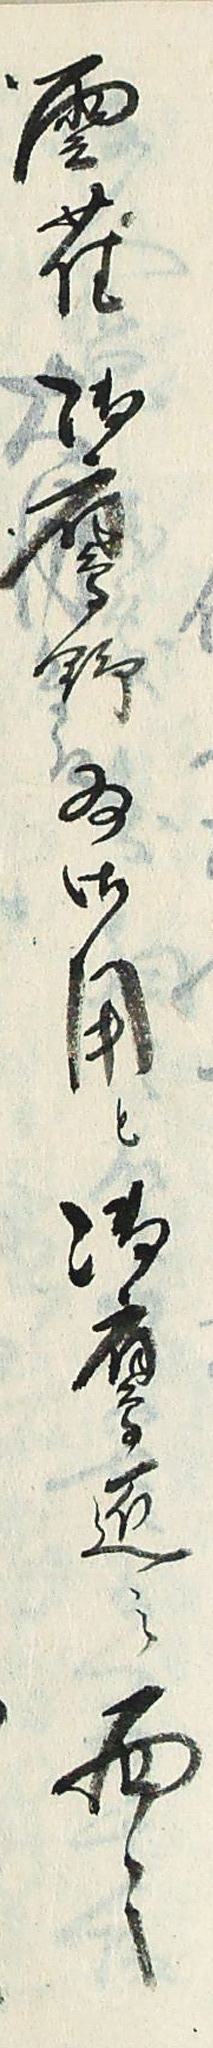雲雀御鷹野為御用と御鷹匠之面々
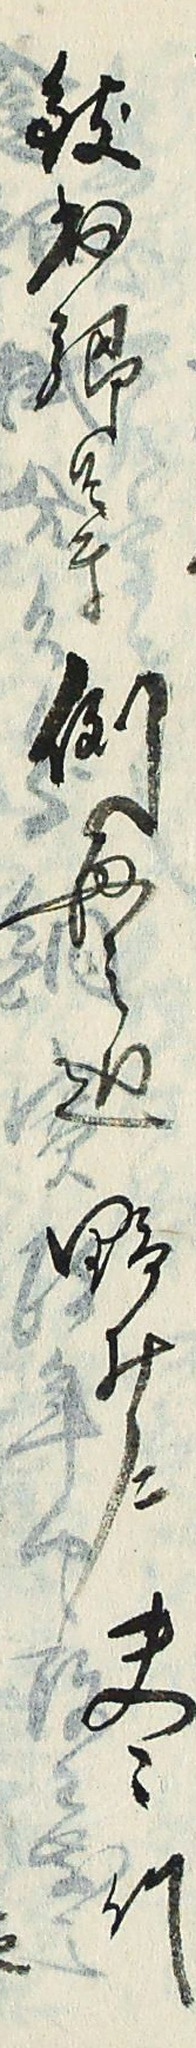致出郷候に付例毎之通野井戸夫々竹
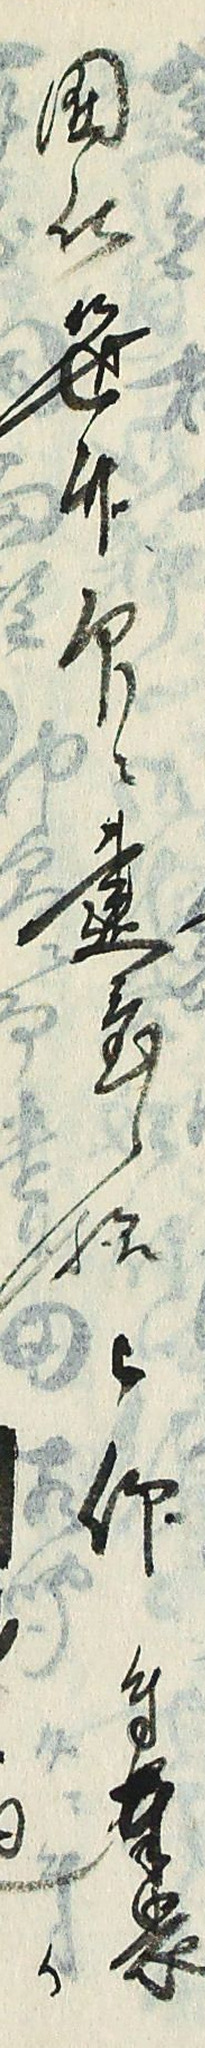囲仕笹竹印に建置候様被仰付奉畏
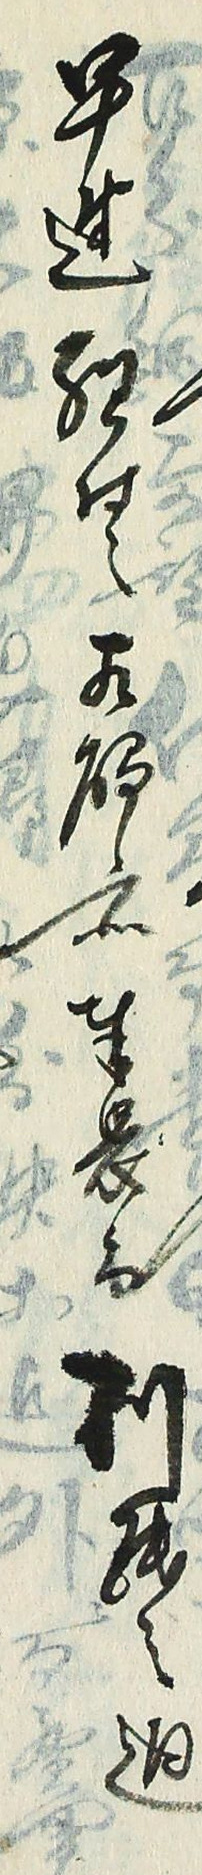早速組村々相触候所奉畏旨別紙之通り
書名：諸御用御□受書控
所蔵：鳴門教育大学 Naruto University of Education
